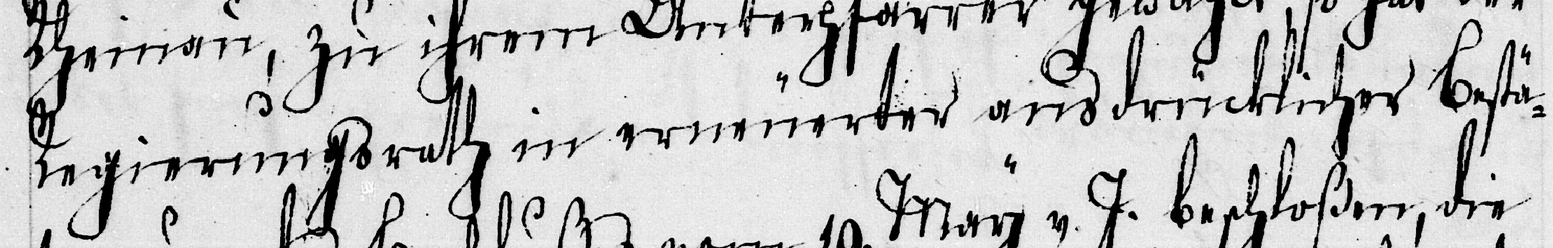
Regierungsrath in erneuerter ausdrücklicher Bestä¬
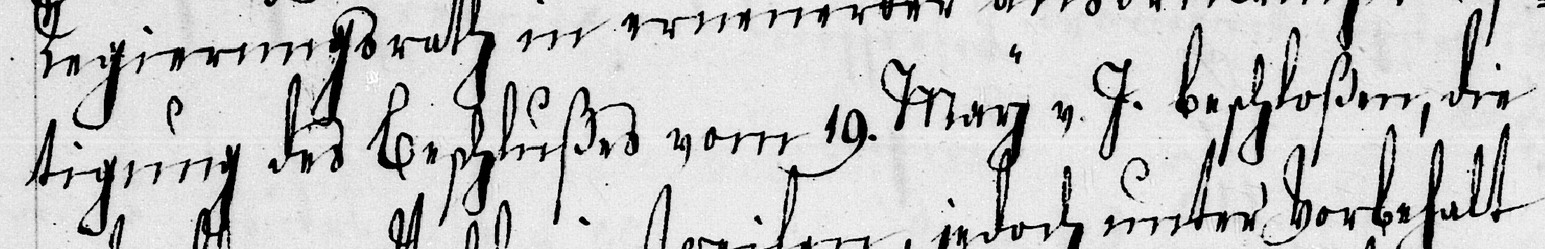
tigung des Beschlußes vom 19. März v. J. beschloßen, die
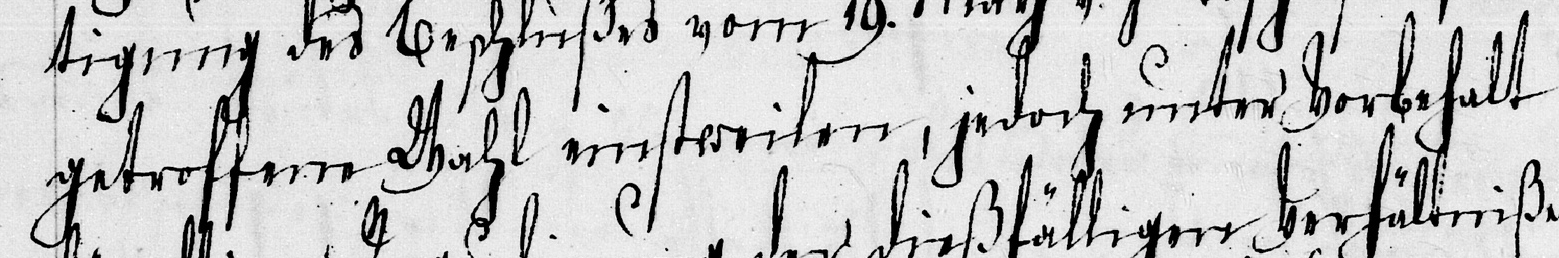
getroffene Wahl einstweilen, jedoch unter Vorbehalt
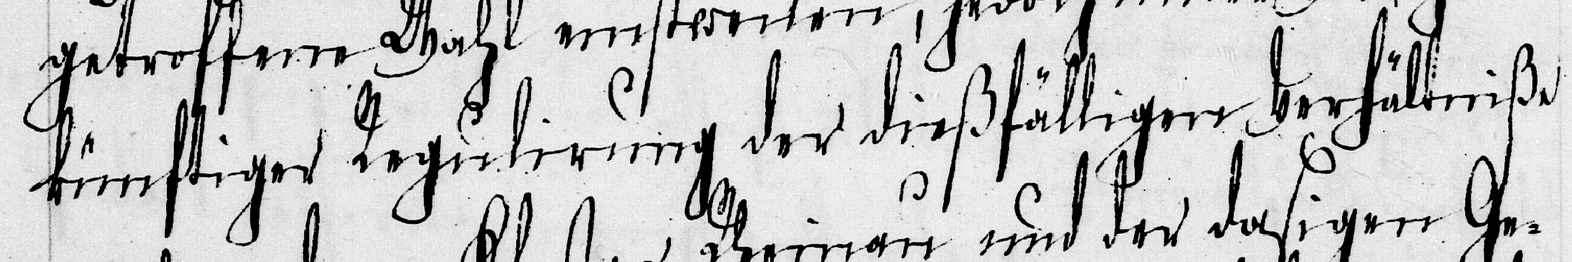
künftiger Regulirung der dießfälligen Verhältniße
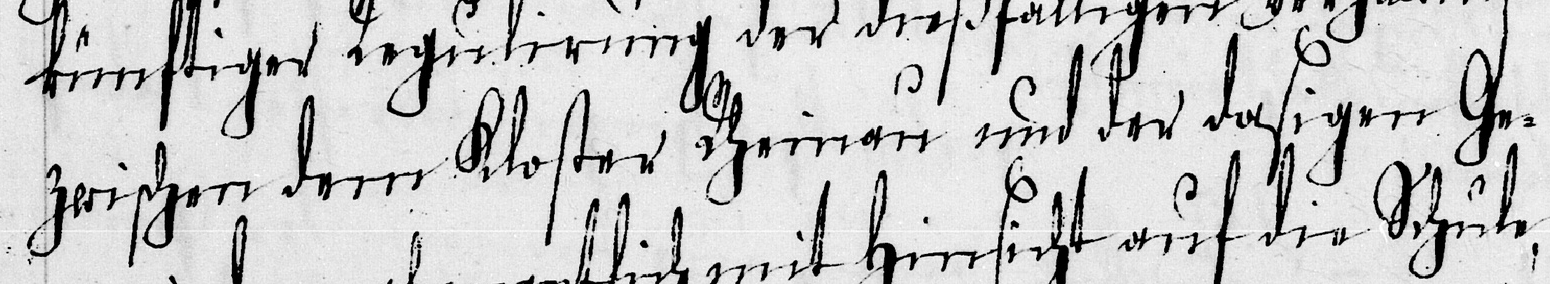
zwischen dem Kloster Rheinau und der dasigen Ge¬
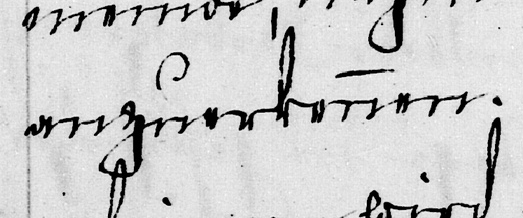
anzuerkennen.
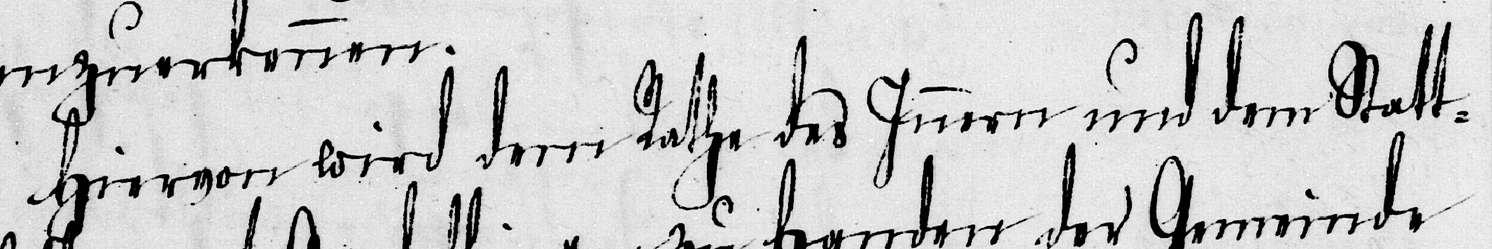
Hiervon wird dem Rathe des Innern und dem Statt¬
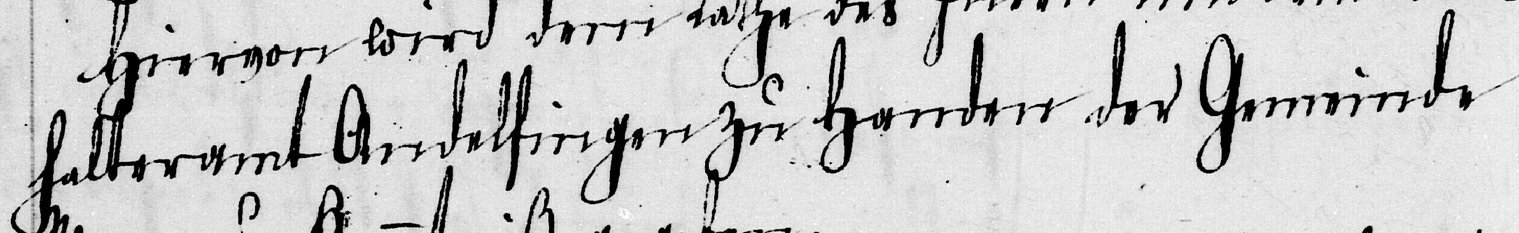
halteramt Andelfingen zu Handen der Gemeinde
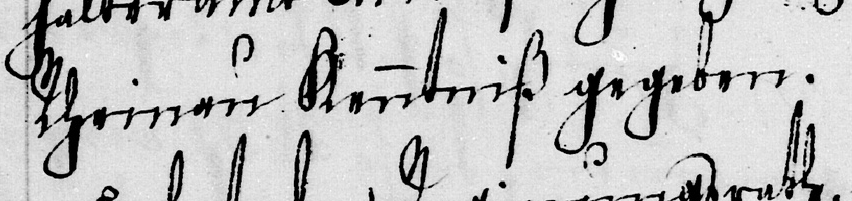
Rheinau Kenntniß gegeben.
